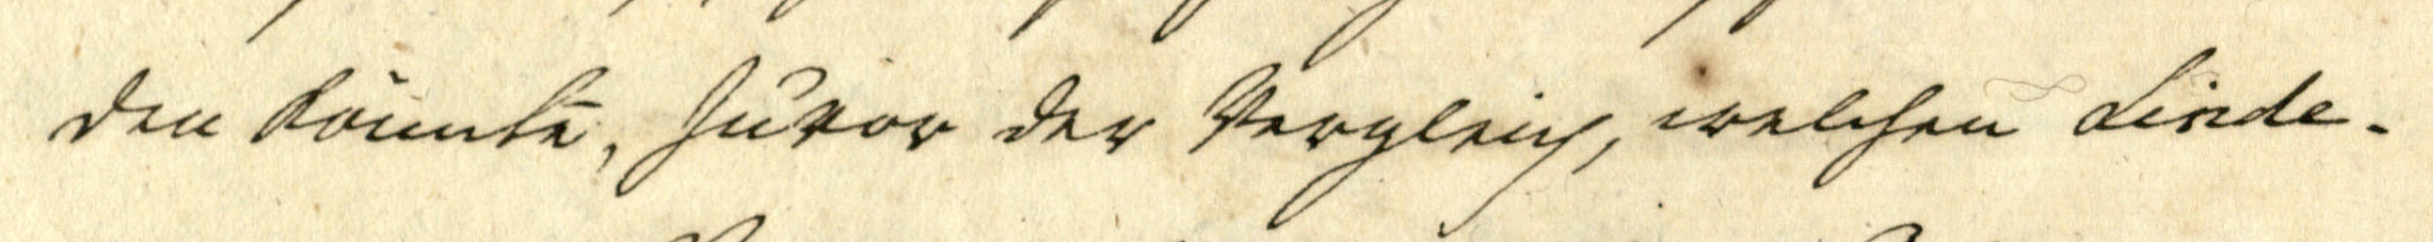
den könnte, zuvor der Vergleich, welchen Linde¬
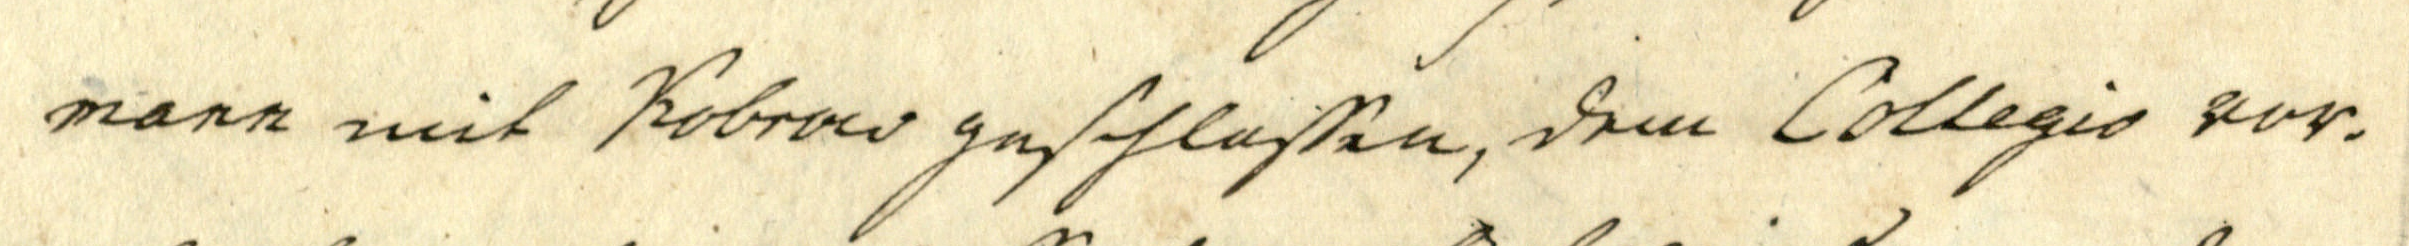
mann mit Kobrow geschlossen, dem Collegio vor¬
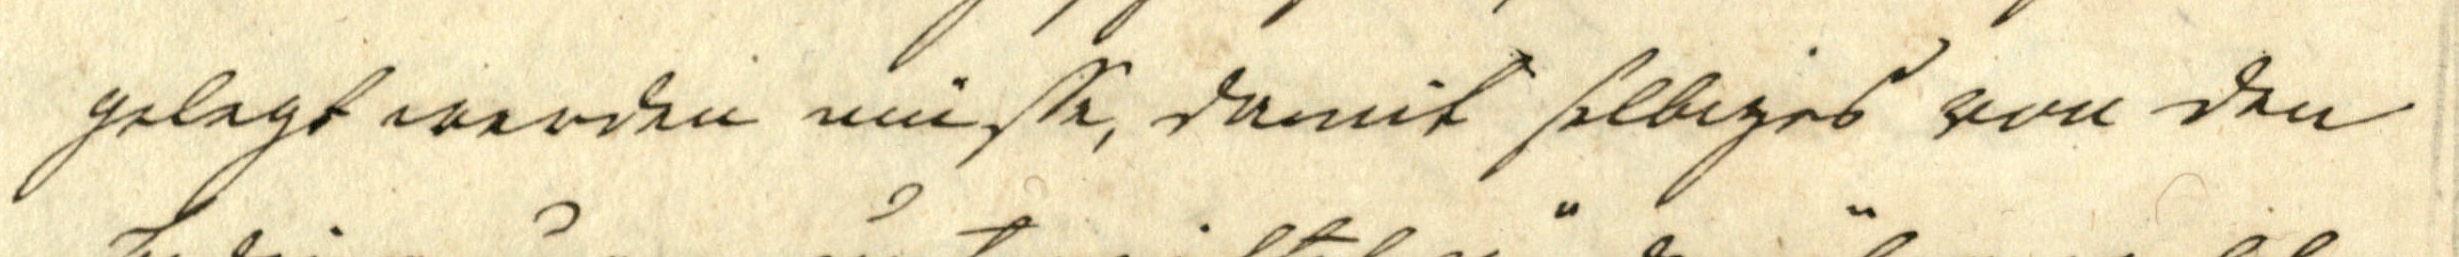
gelegt werden müsse, damit selbiges von den
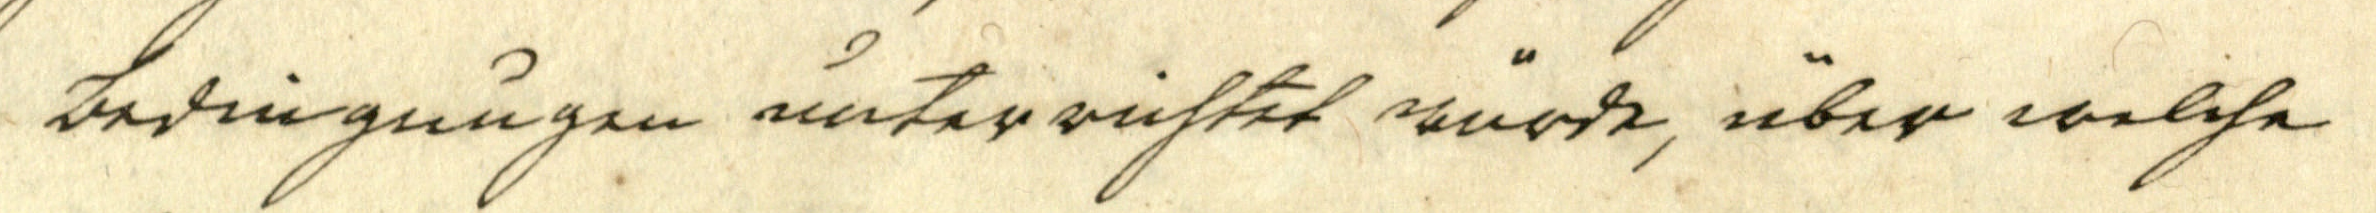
Bedingungen unterrichtet würde, über welche
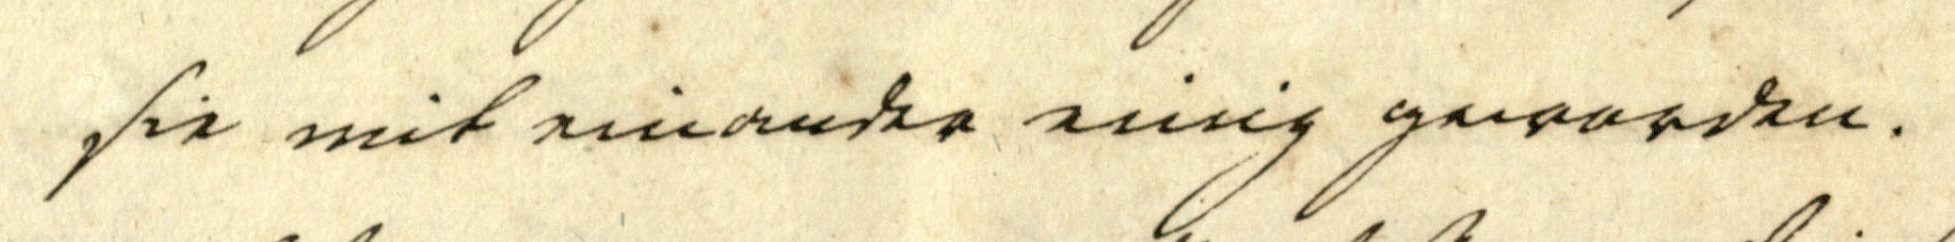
sie mit einander einig geworden.
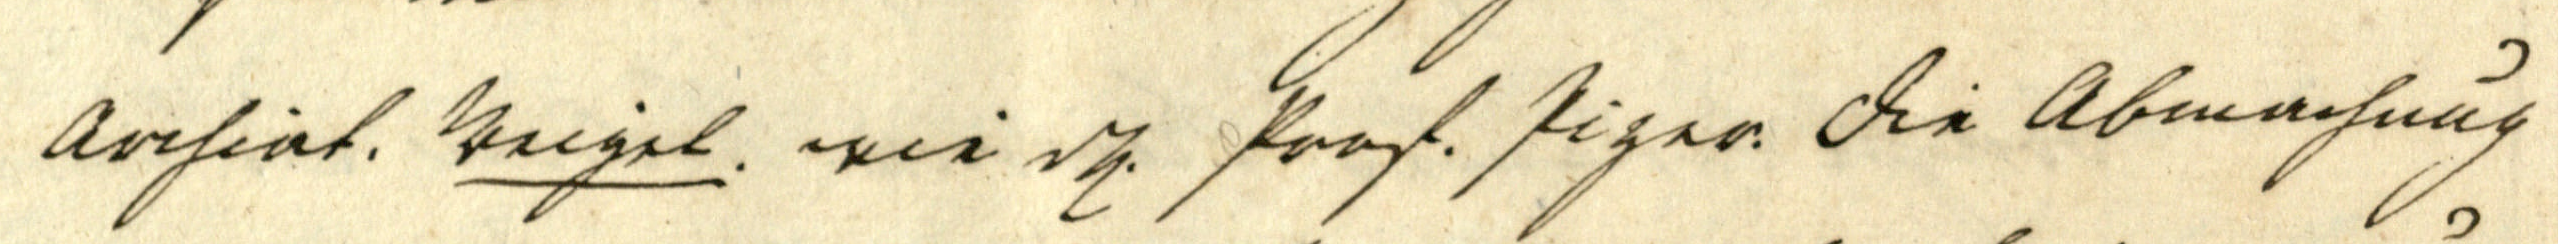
Archiat. Weigel. wie dh. Prof. Piper. Die Abmachung
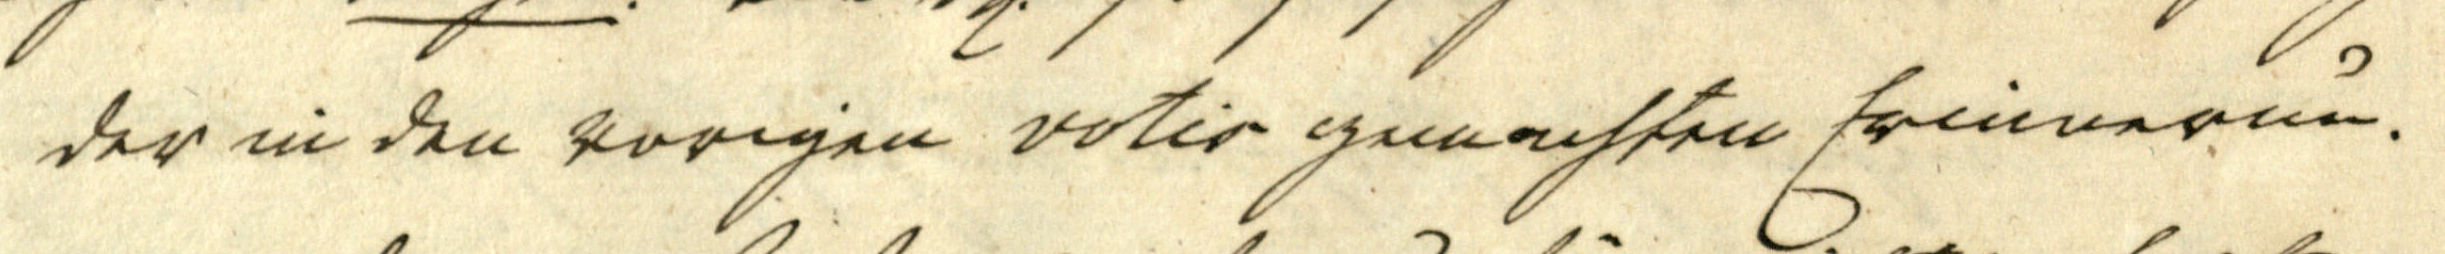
der in den vorigen votis gemachten Erinnerun¬
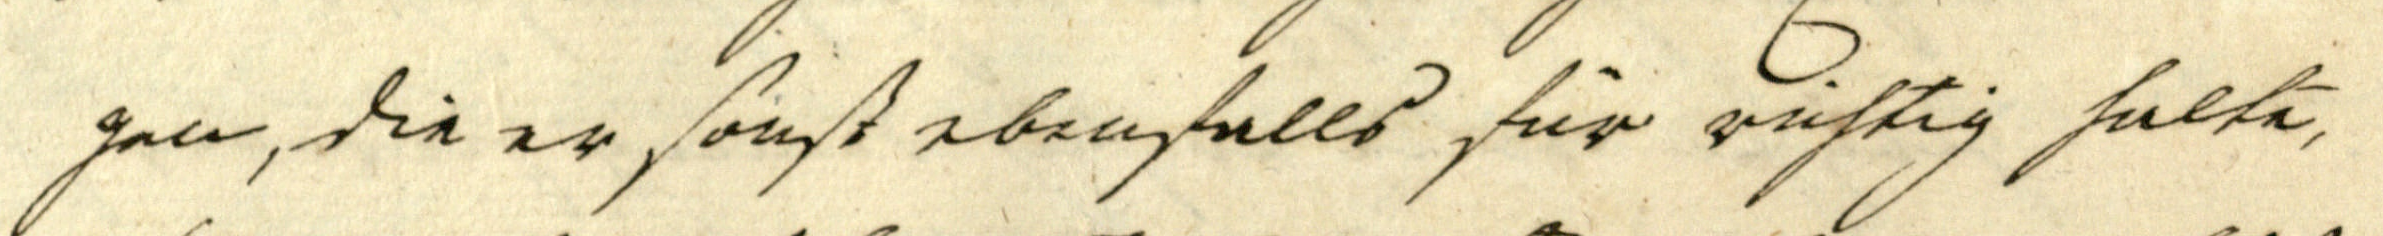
gen, die er sonst ebenfalls für richtig halte,
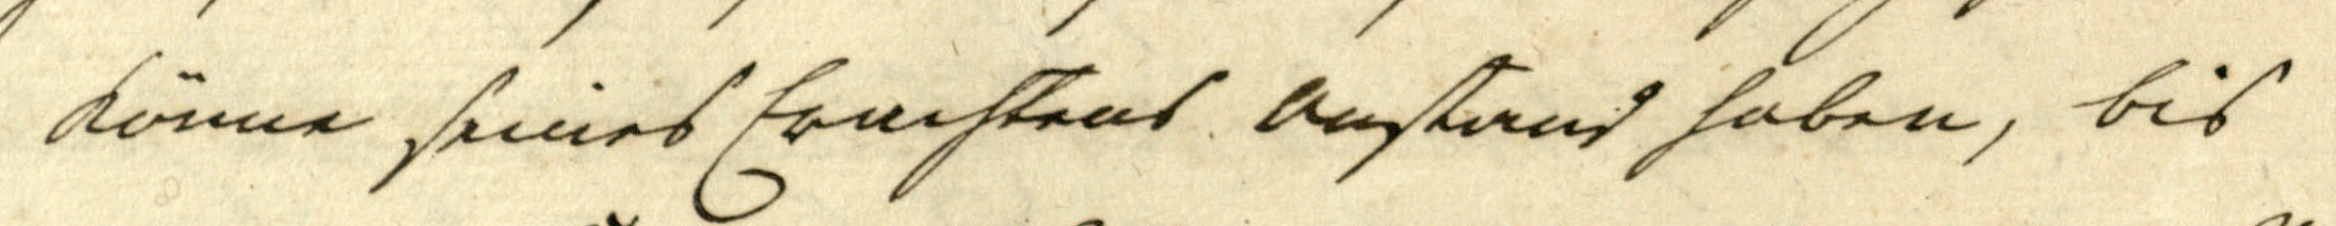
könne seines Erachtens Anstand haben, bis
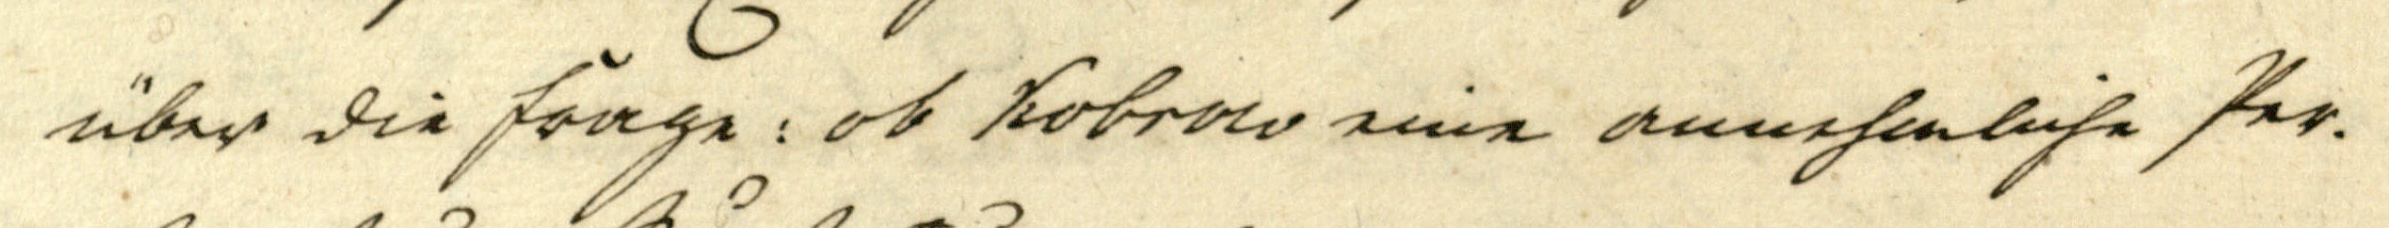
über die Frage: ob Kobrow eine annnehmliche Per¬
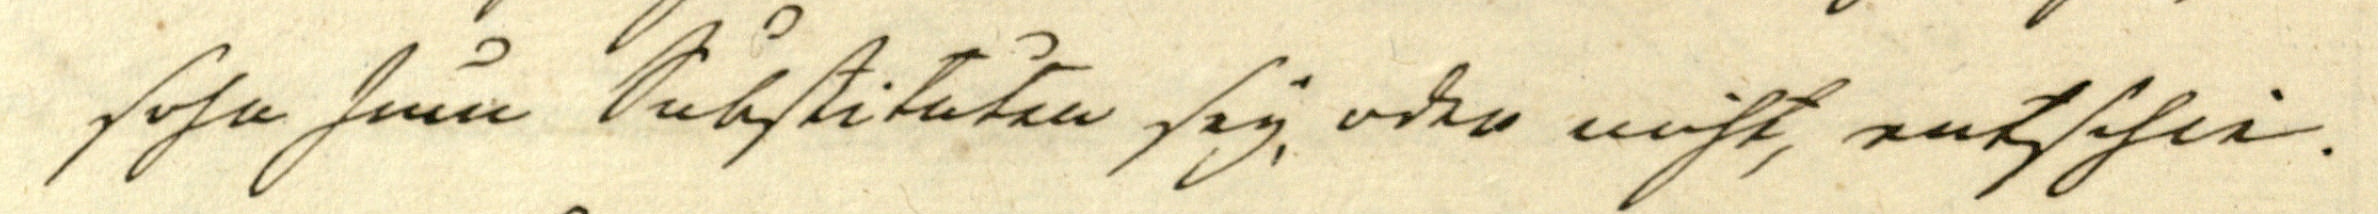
sohn zum Substituten seÿ, oder nicht, entschie¬
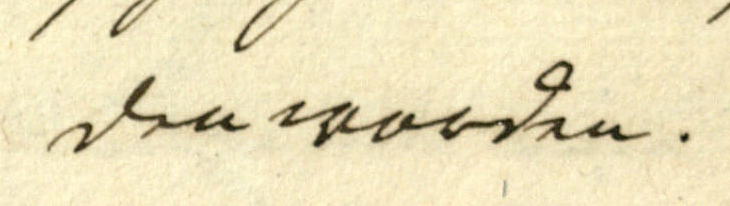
den worden.
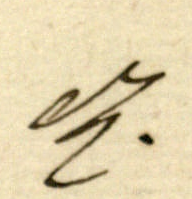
dh.
